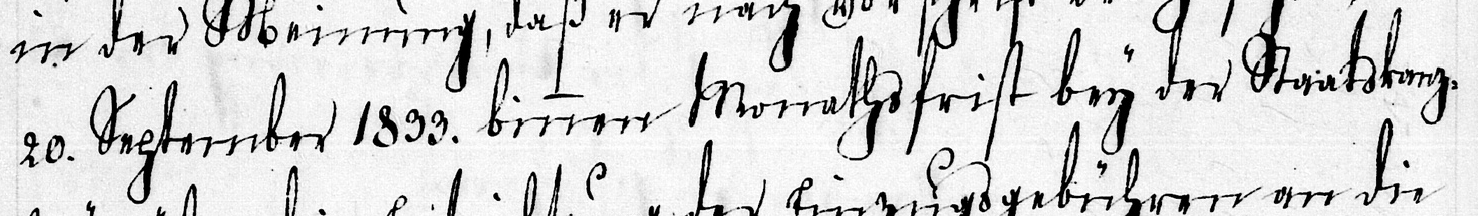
20. September 1833. binnen Monathsfrist bey der Staatskanz¬
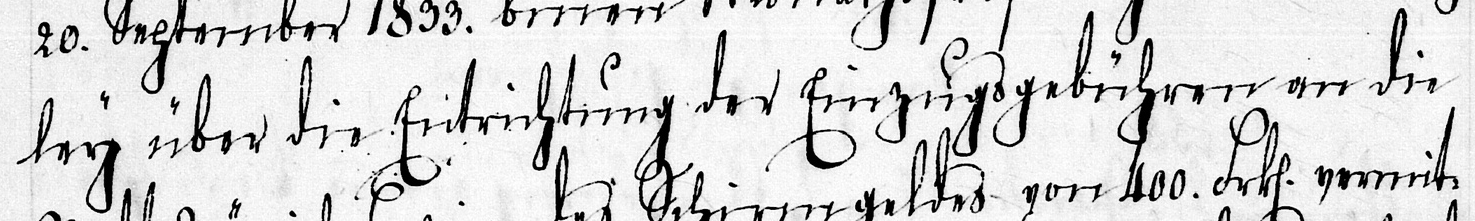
ley über die Entrichtung der Einzugsgebühren an die
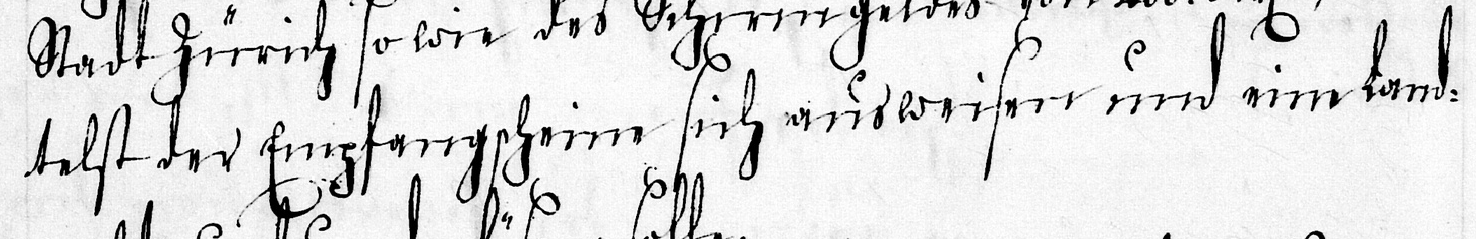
telst der Empfangscheine sich ausweisen und eine Land¬
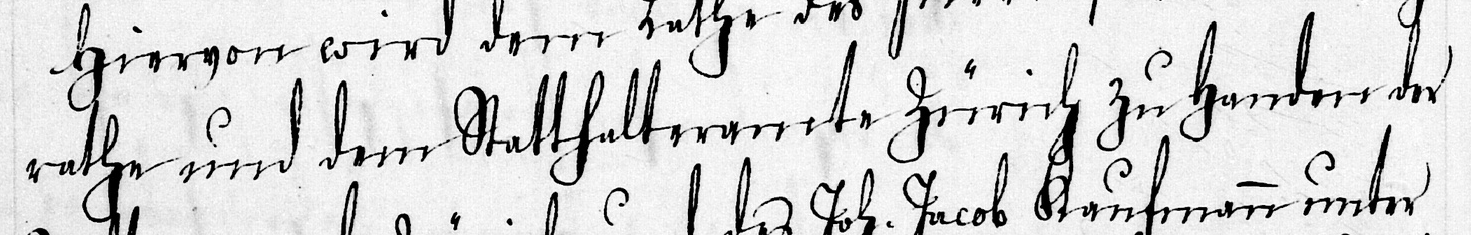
rathe und dem Statthalteramte Zürich zu Handen der
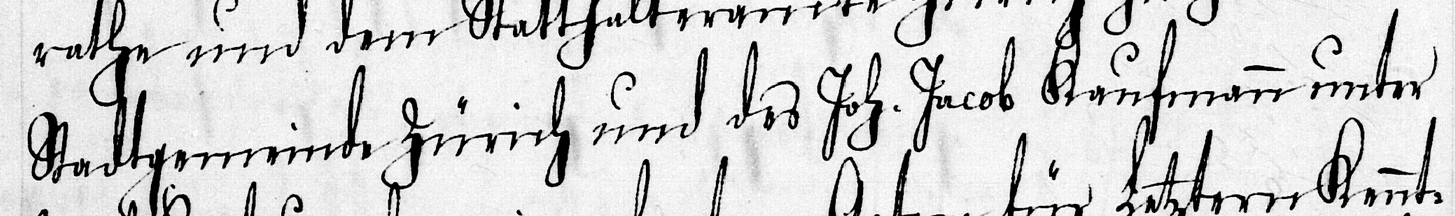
Stadtgemeinde Zürich und des Joh. Jacob Kaufmann unter
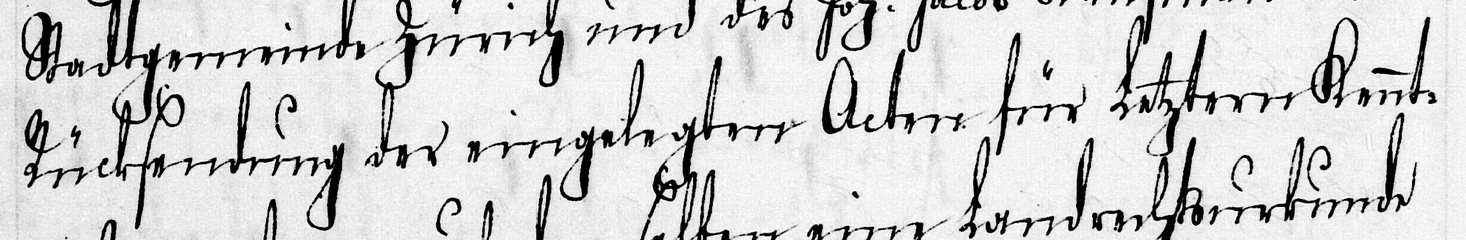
Rücksendung der eingelegten Acten für Letztern Kennt¬
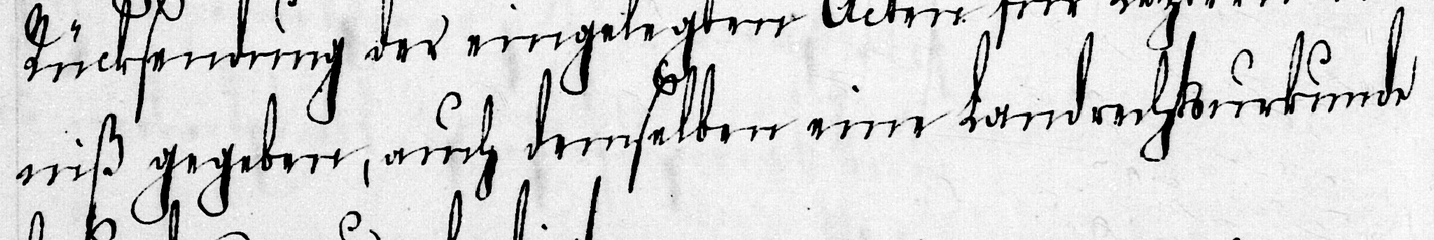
niß gegeben, auch demselben eine Landrechtsurkunde
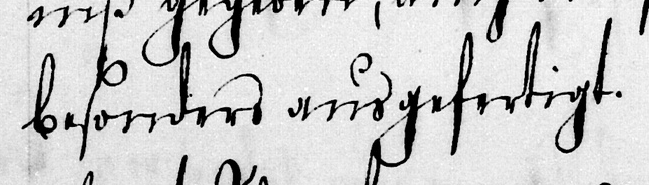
besonders ausgefertigt.
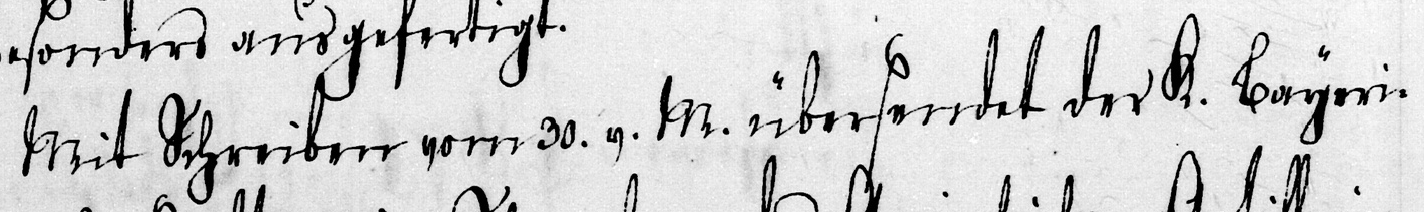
Mit Schreiben vom 30. v. M. übersendet der K. Bayeri¬
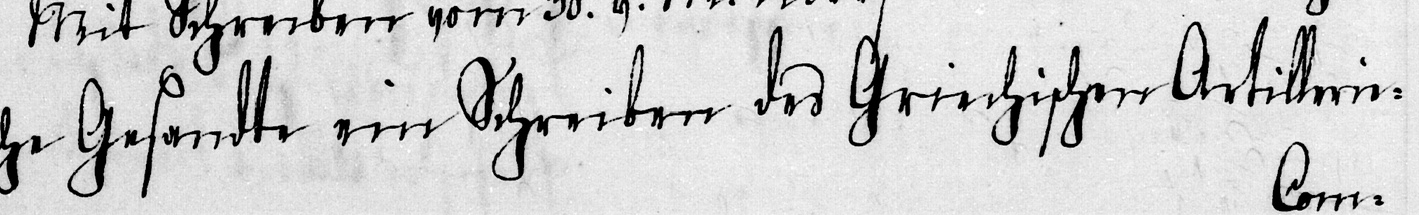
e Gesandte ein Schreiben des Griechischen Artiller¬
